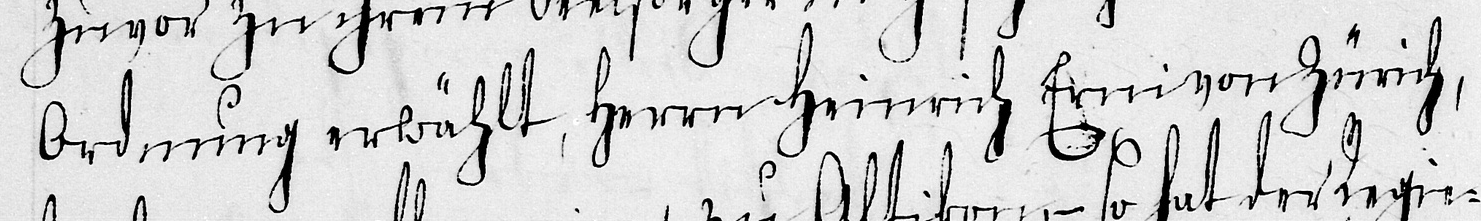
Ordnung erwählt, Herrn Heinrich Erni von Zürich,
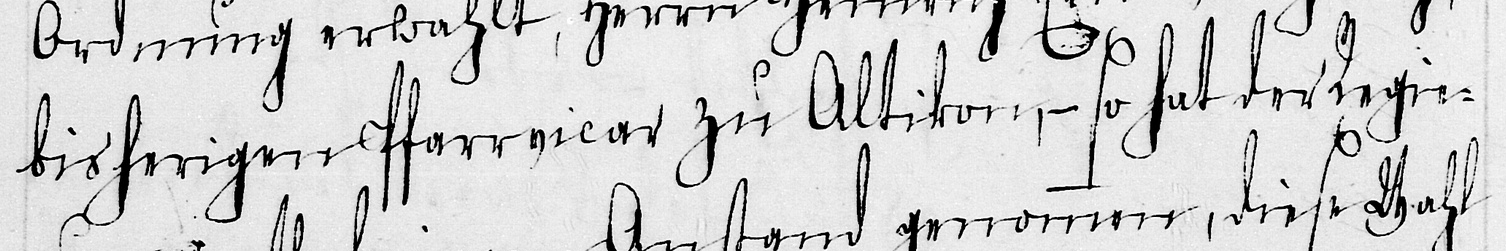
bisherigen Pfarrvicar zu Altikon, – so hat der Regie¬
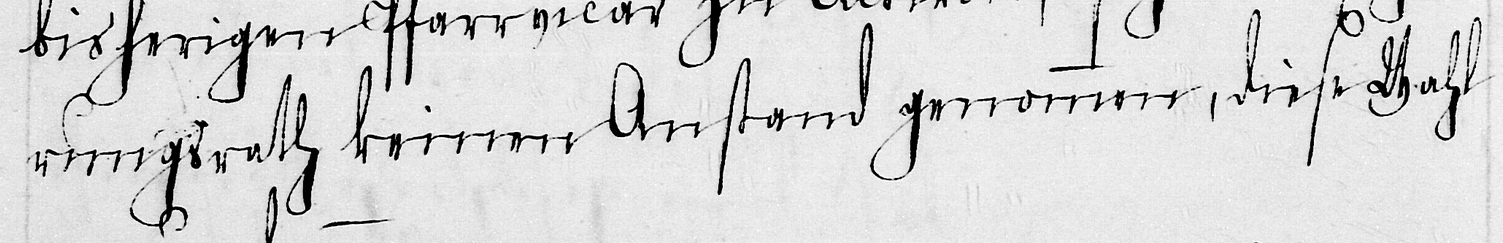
rungsrath keinen Anstand genommen, diese Wahl
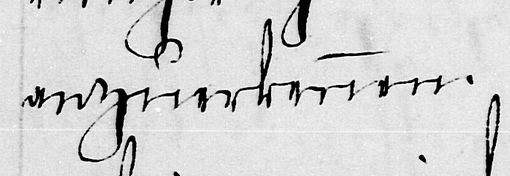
anzuerkennen.
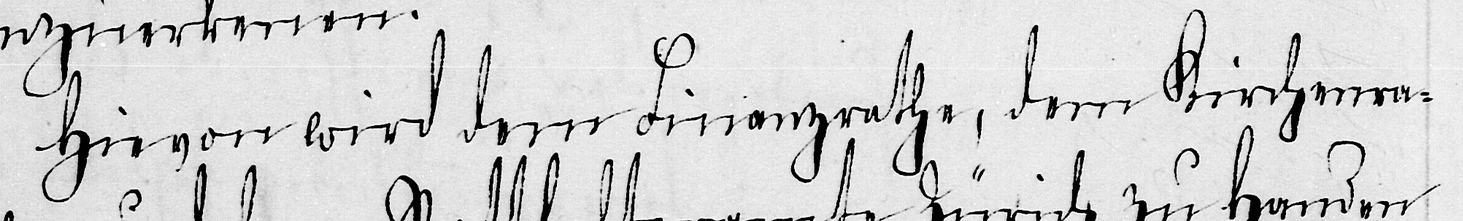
Hievon wird dem Finanzrathe, dem Kirchenr¬
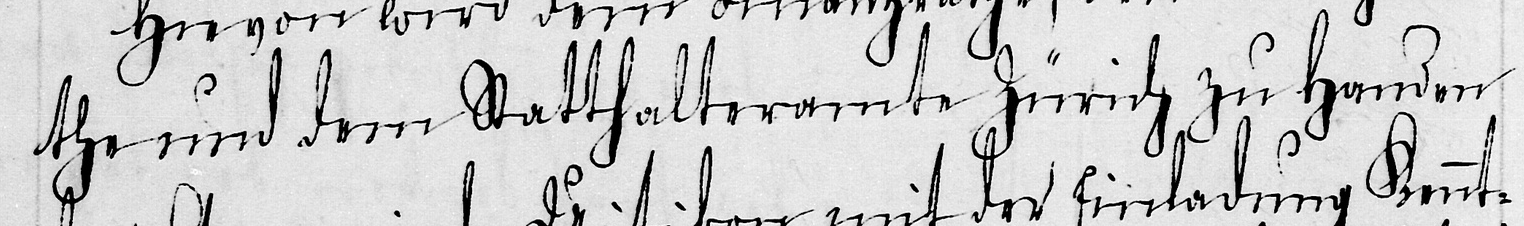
athe und dem Statthalteramte Zürich zu Handen
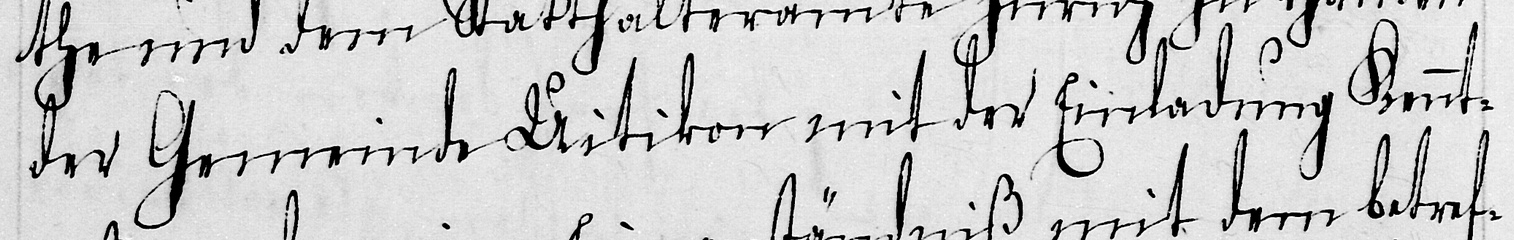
der Gemeinde Uitikon mit der Einladung Kennt¬
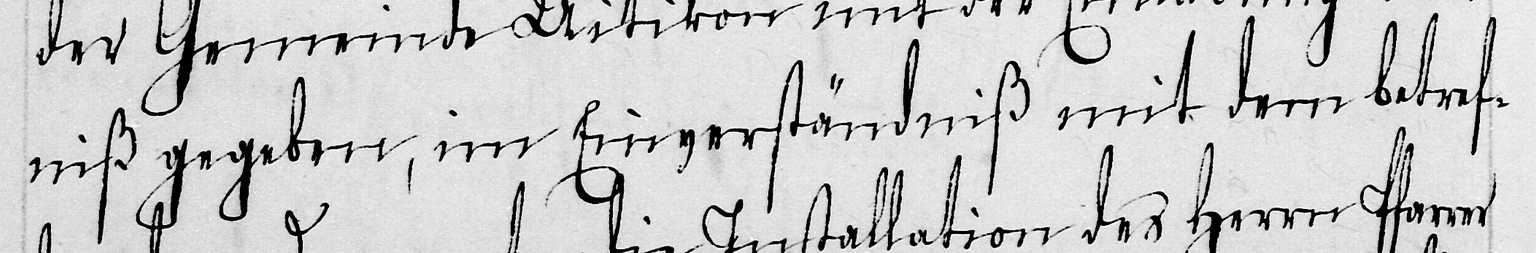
niß gegeben, im Einverständniß mit dem betref¬
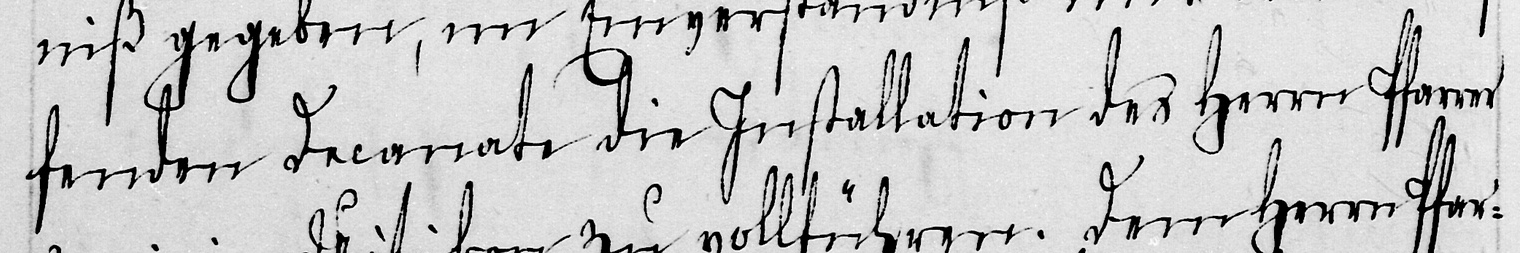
fenden Decanate die Installation des Herrn Pfar¬
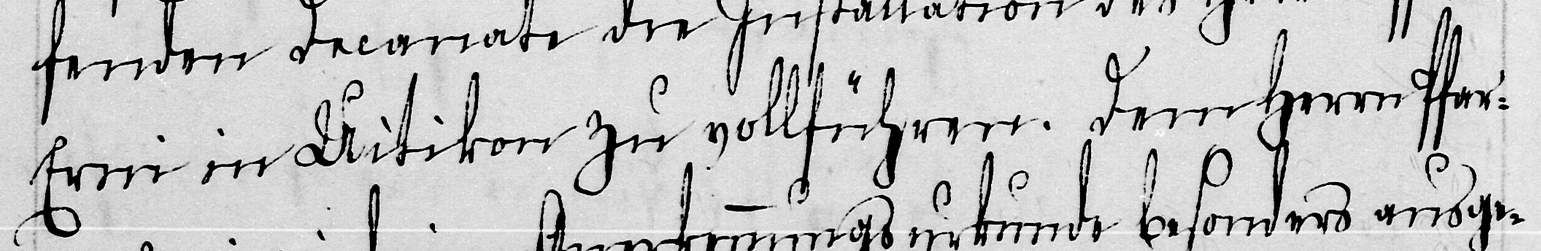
Erni in Uitikon zu vollführen. Dem Herrn Pfar¬
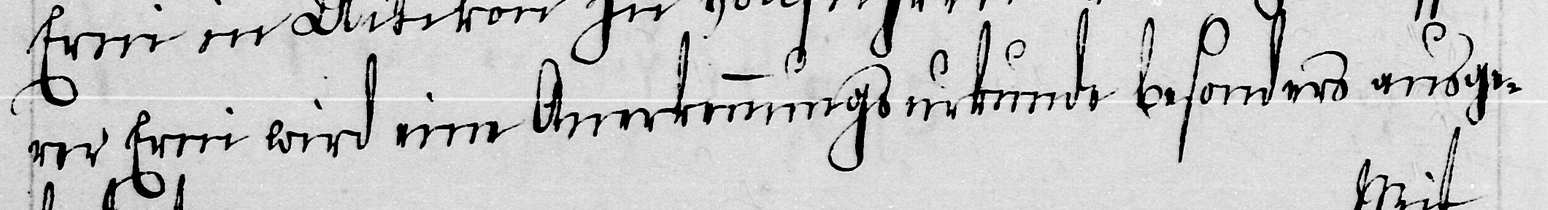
rer Erni wird eine Anerkennungsurkunde besonders ausge¬
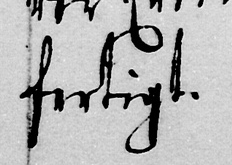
fertig¬
